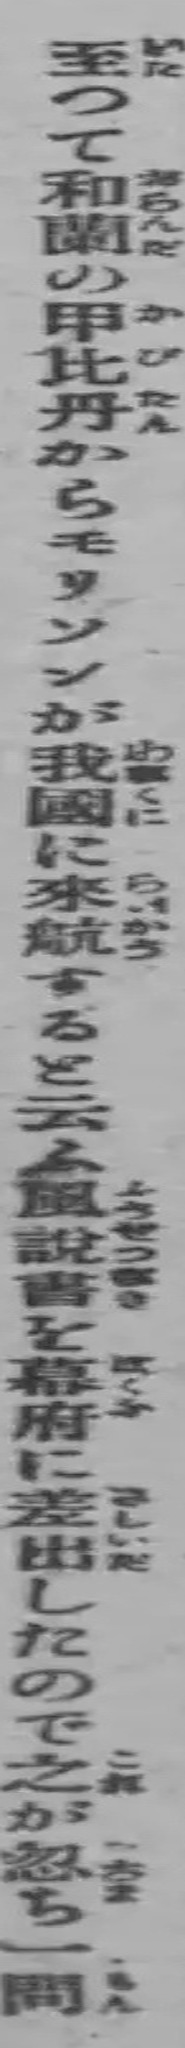至つて和蘭の甲比丹からモリソンが我国に来航すると云ふ風説書を幕府に差出したので之が忽ち一問
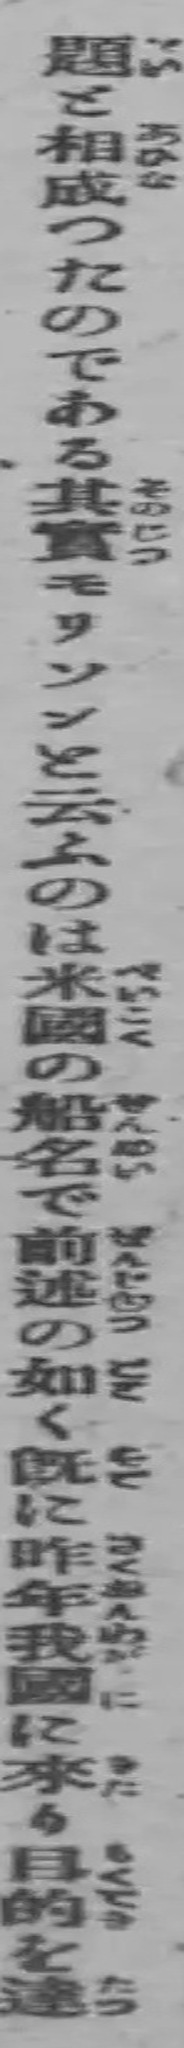題と相成つたのである其実モリソンと云ふのは米国の船名で前述の如く既に昨年我国に来り目的を達
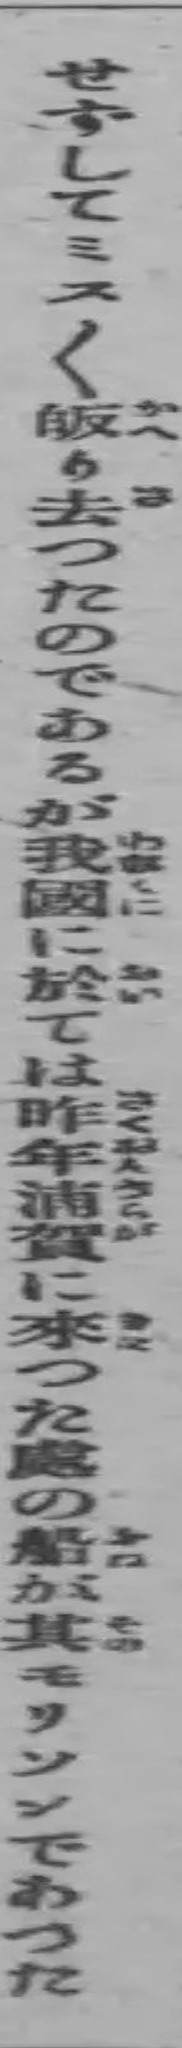せずしてミス〳〵皈り去つたのであるが我国に於ては昨年浦賀に来つた処の船が其モリソンであつた
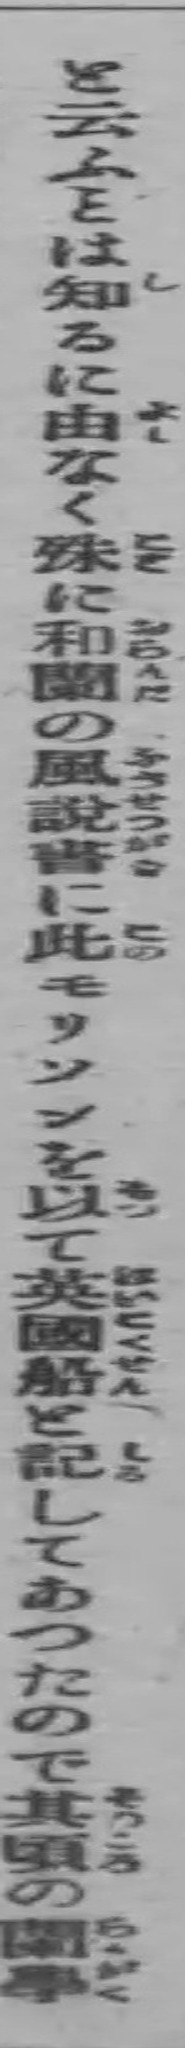と云ふことは知るに由なく殊に和蘭の風説書に此モリソンを以て英国船と記してあつたので其頃の蘭学
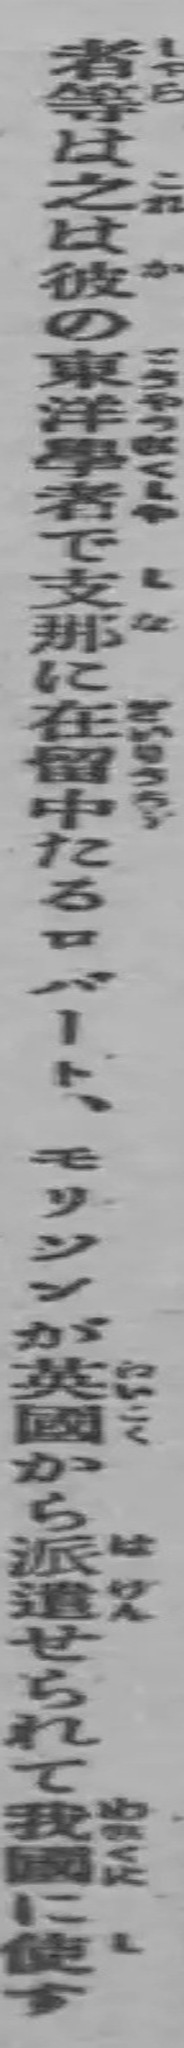者等は之は彼の東洋学者で支那に在留中たるロバート、モリソンが英国から派遣せられて我国に使す
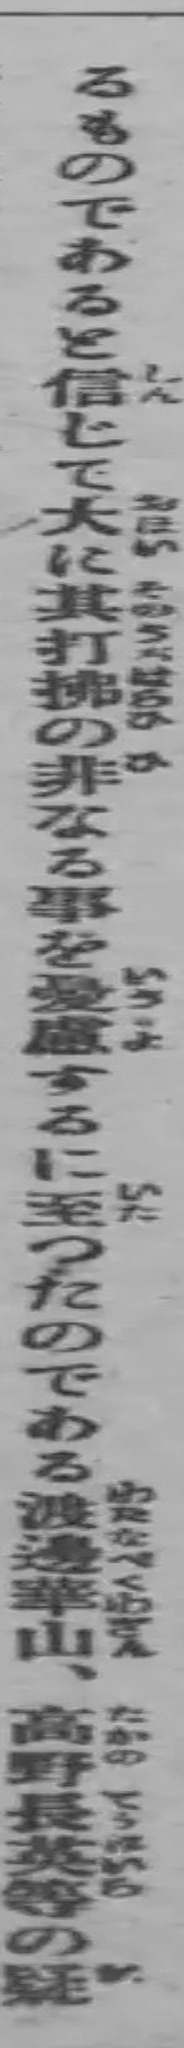るものであると信じて大に其打払の非なる事を憂慮するに至つたのである渡辺崋山、高野長英等の疑
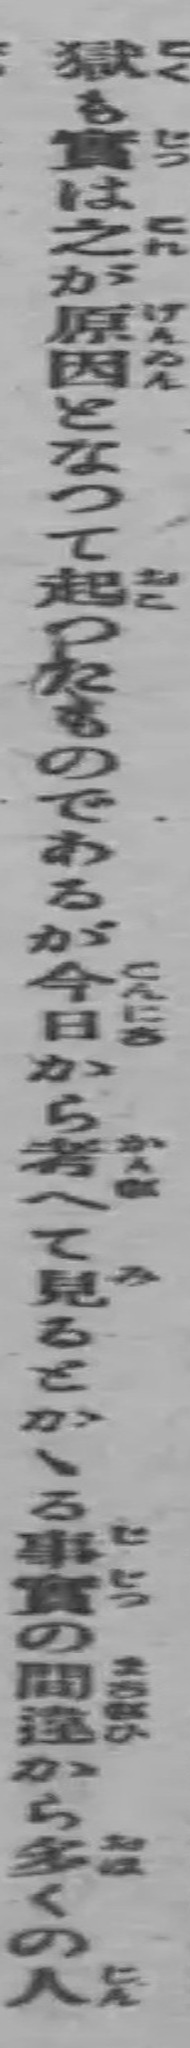獄も実は之が原因となつて起つたものであるが今日から考へて見るとかゝる事実の間違から多くの人
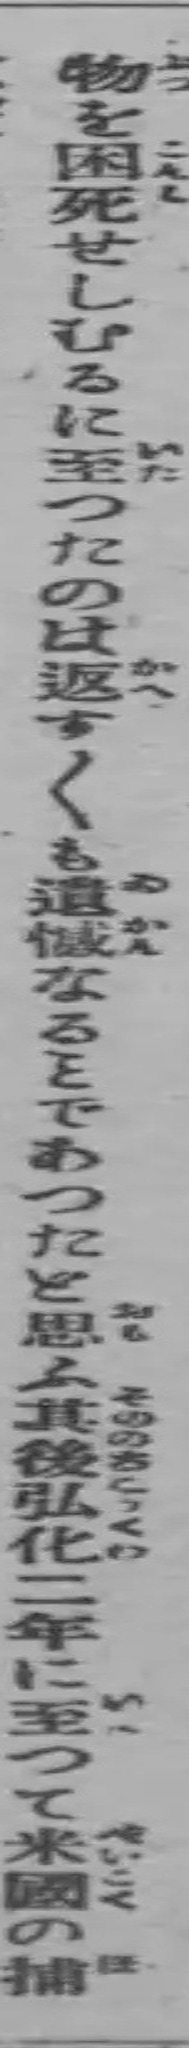物を困死せしむるに至つたのは返す〳〵も遺憾なることであつたと思ふ其後弘化二年に至つて米国の捕
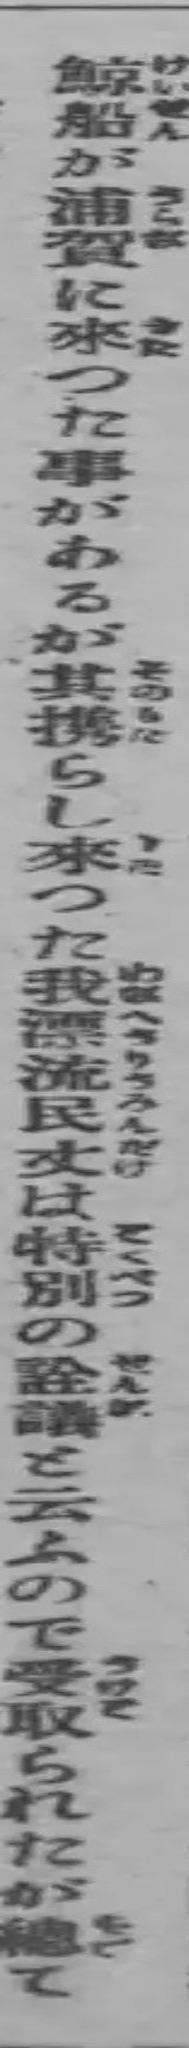鯨船が浦賀に来つた事があるが其携らし来つた我漂流民丈は特別の詮議と云ふので受取られたが総て
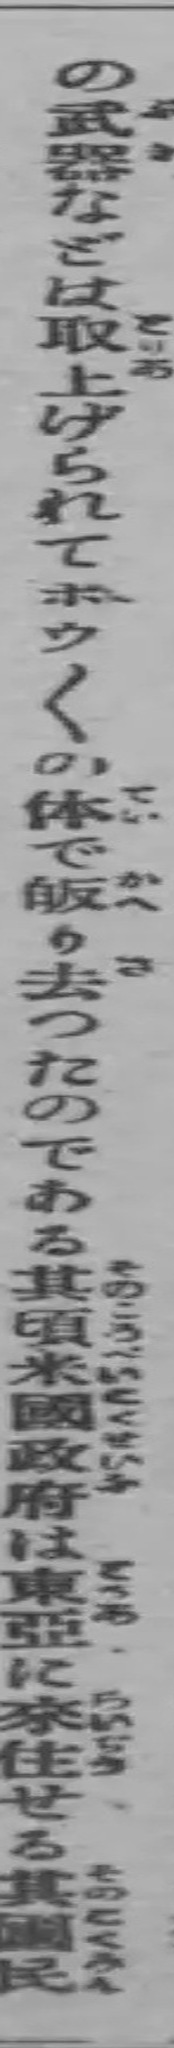の武器などは取上げられてホウ〳〵の体で皈り去つたのである其頃米国政府は東亜に来住せる其国民
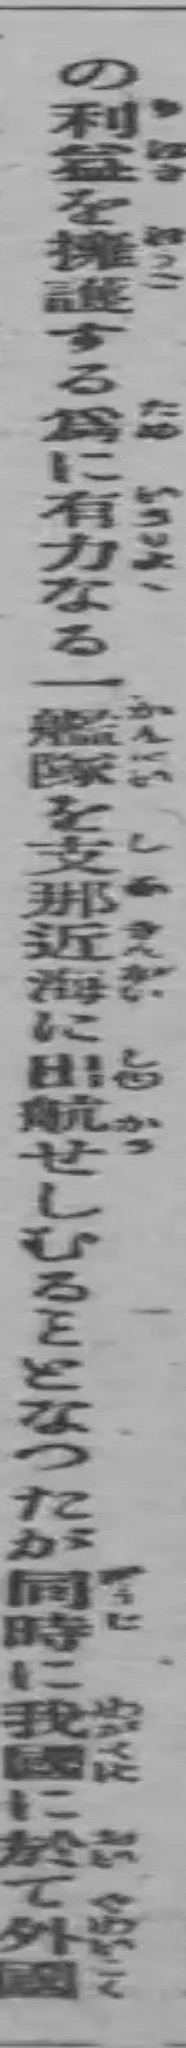の利益を擁護する為に有力なる一艦隊を支那近海に出航せしむることとなつたが同時に我国に於て外国
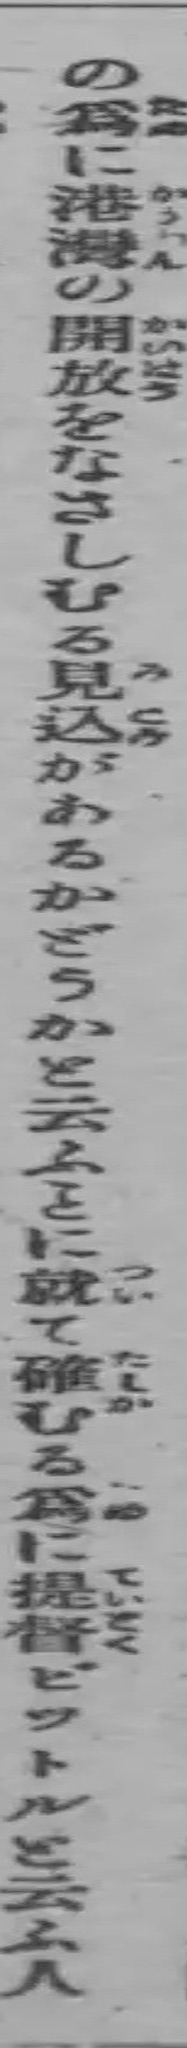の為に港湾の開放をなさしむる見込があるかどうかと云ふことに就て確むる為に提督ビツトルと云ふ人
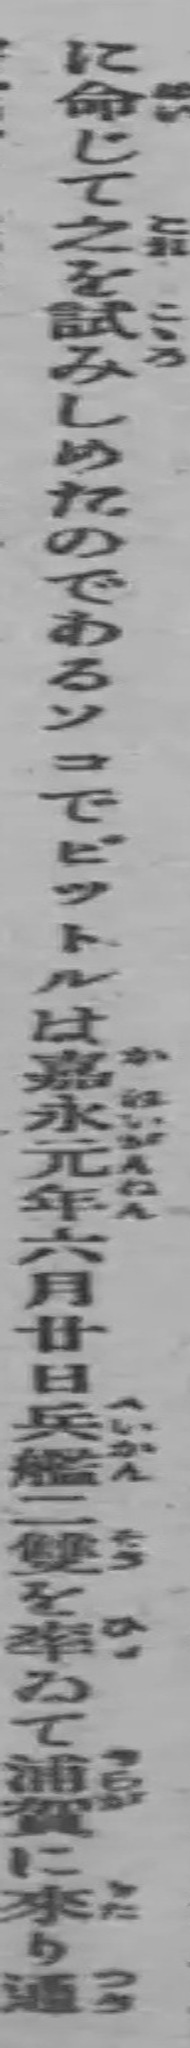に命じて之を試みしめたのであるソコでビツトルは嘉永元年六月廿日米艦二雙を率ゐて浦賀に来り通
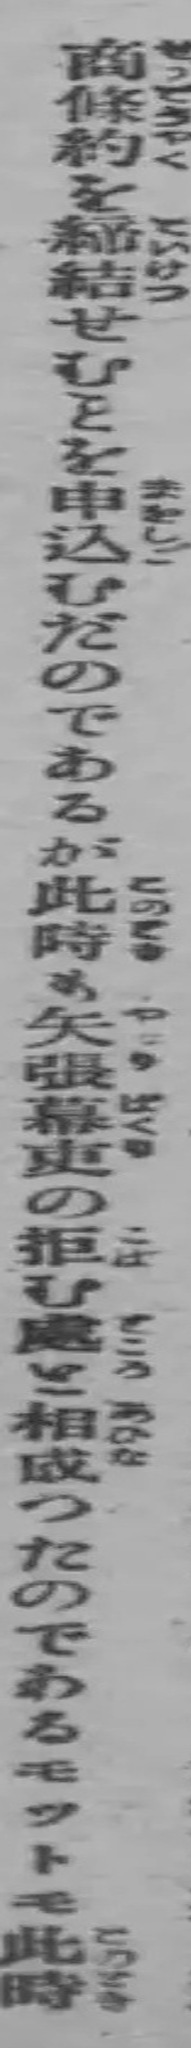商条約を締結せむことを申込むだのであるが此時も矢張幕吏の拒む処と相成つたのであるモツトモ此時
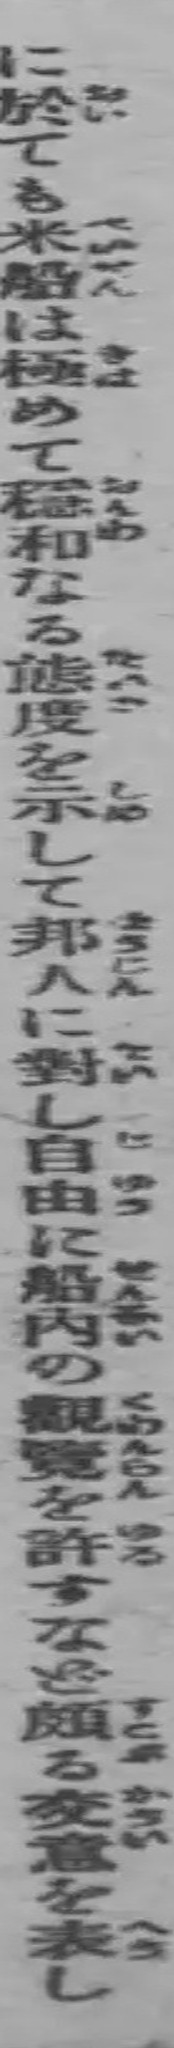に於ても米船は極めて穏和なる態度を示して邦人に対し自由に船内の観覧を許すなど頗る交意を表し
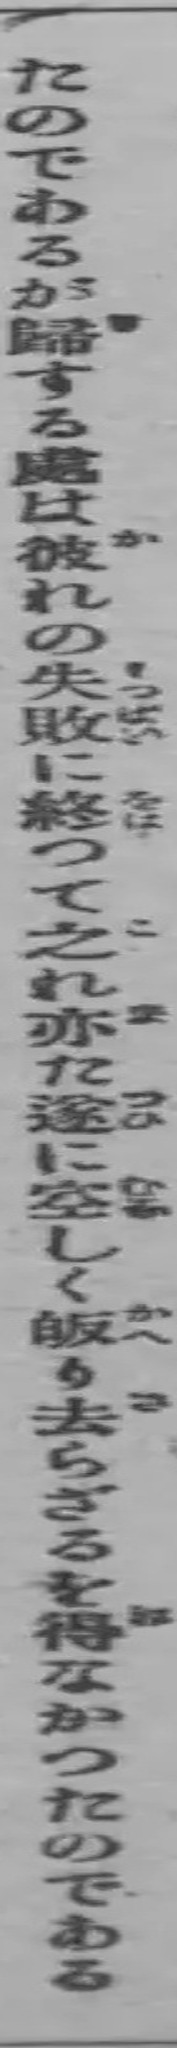たのであるが帰する処は彼れの失敗に終つて之れ亦た遂に空しく皈り去らざるを得なかつたのである
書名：豊橋市史談
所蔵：国立国会図書館 National Diet Library, JAPAN
